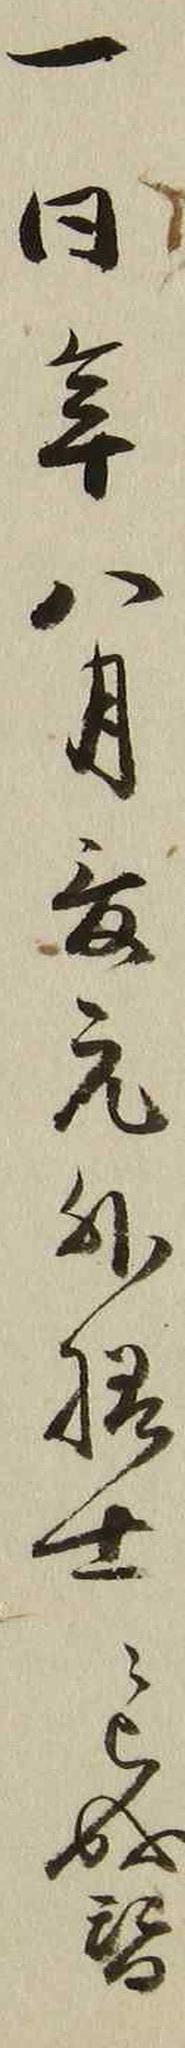一同年八月爰元外様士ニ被成替
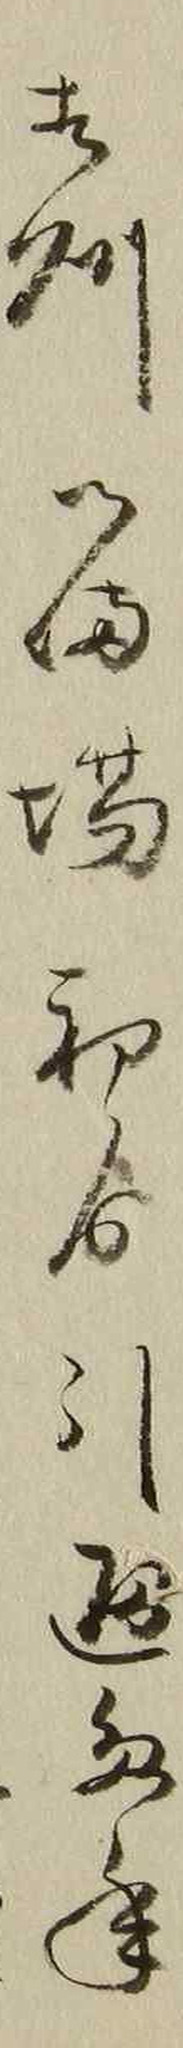相州御備場初ゟ引通多年
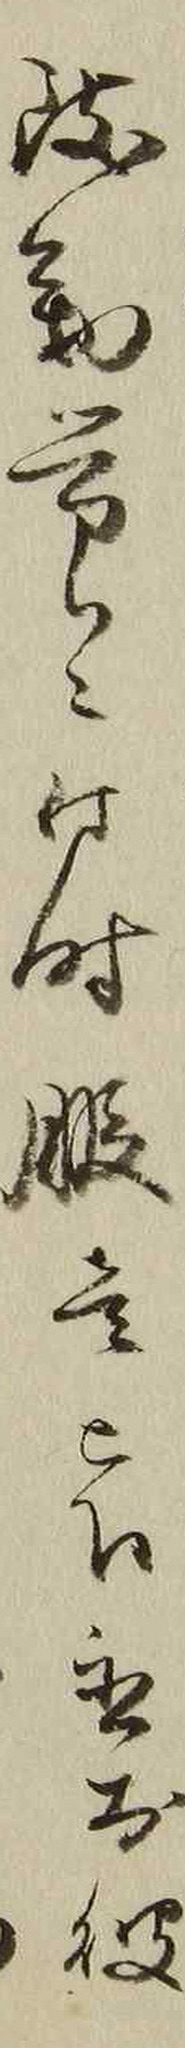致勤労候ニ付時服壱被下置於彼
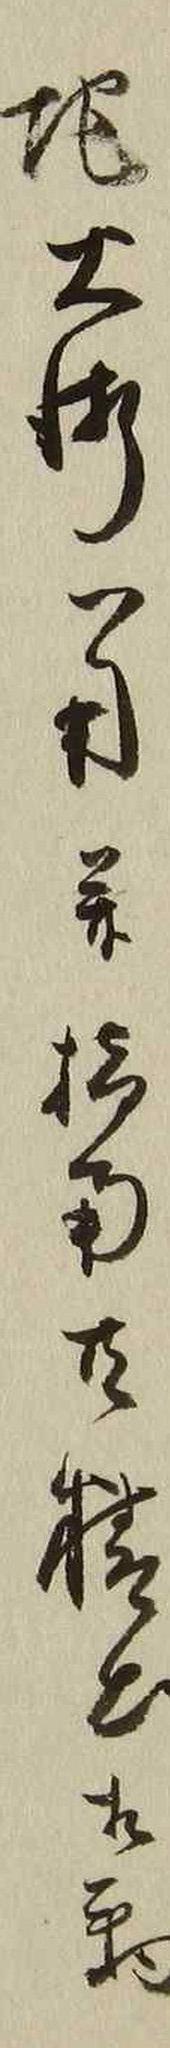地火術御用并指南共精出相勤
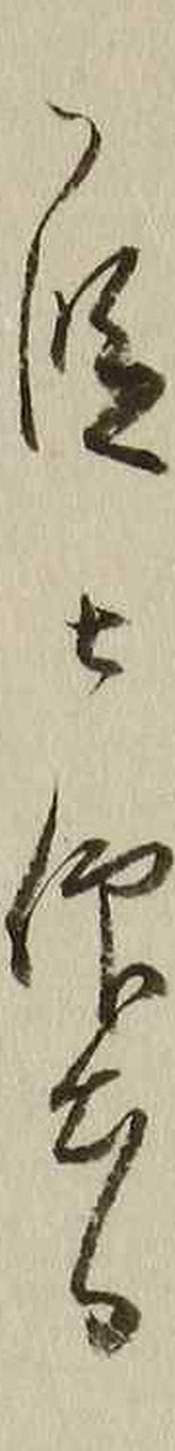候段被仰出候
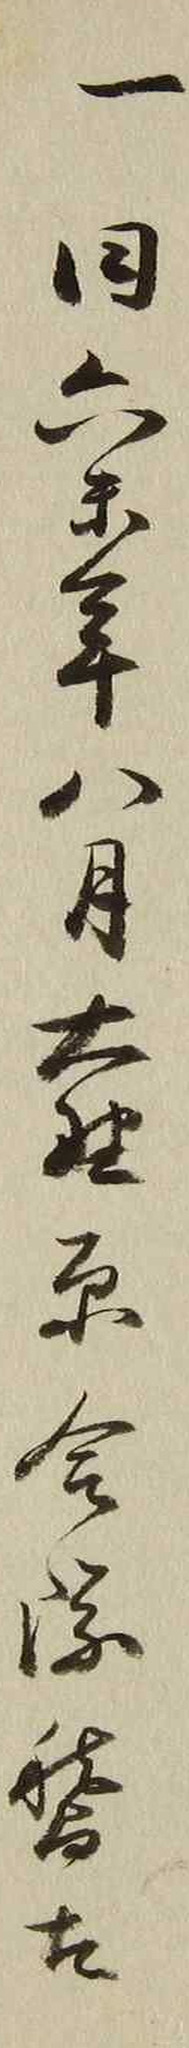一同六未年八月大野原合隊稽古
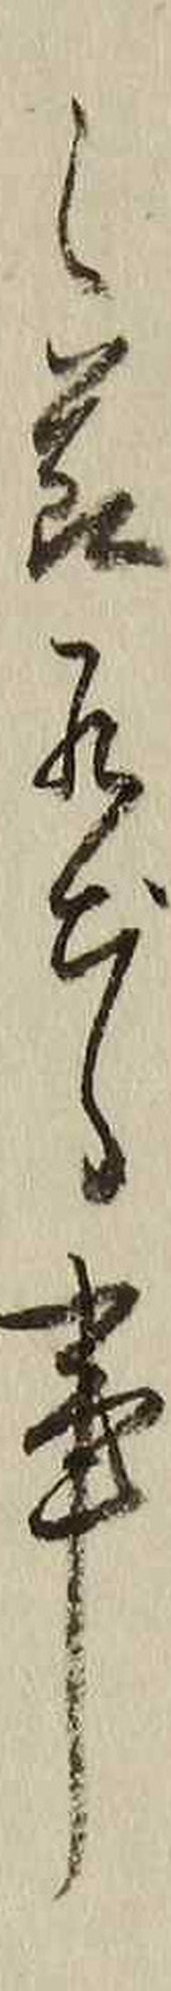之節罷出候事
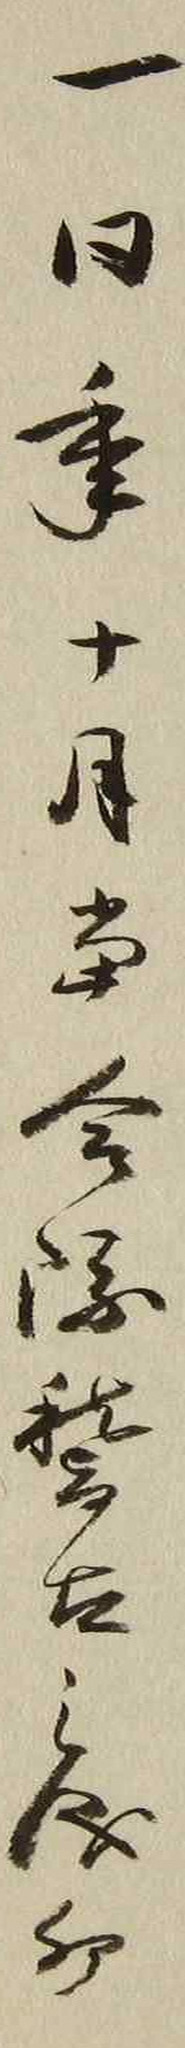一同年十月当合隊稽古之儀卯
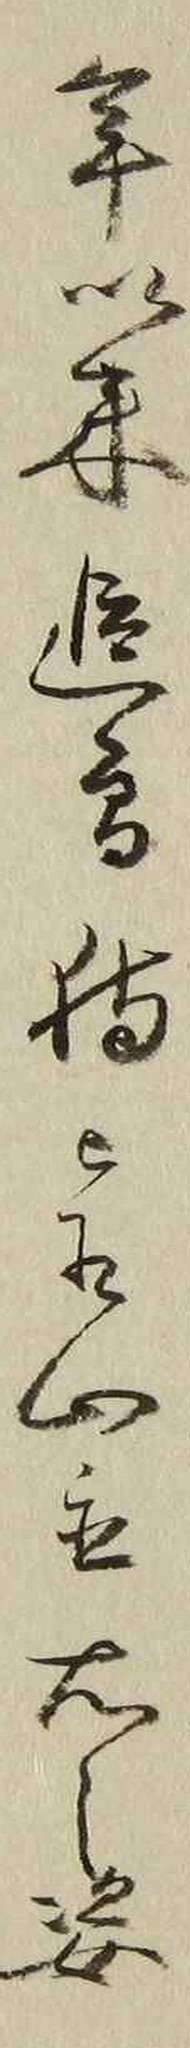年以米追鳥狩被相止置右之姿
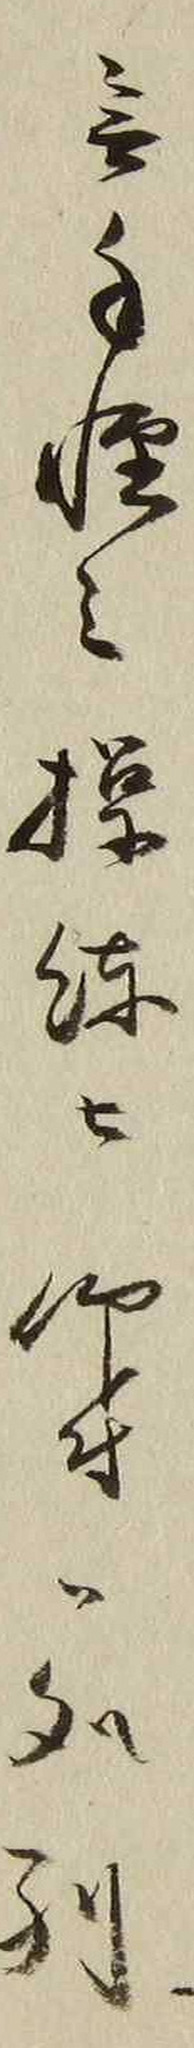ニ而手軽之操練被仰付候処列
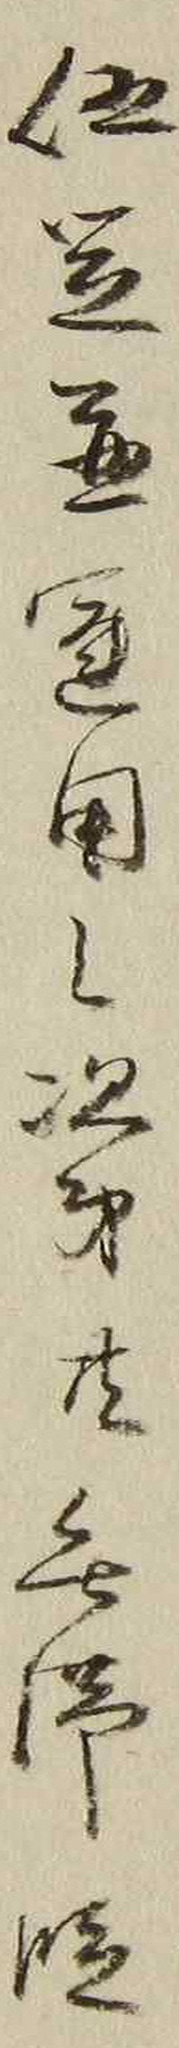伍足並運用之次第共無滞段
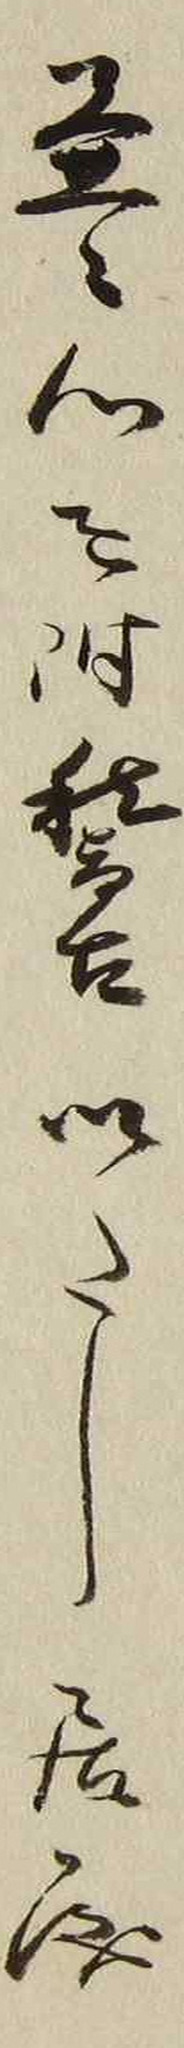益々心を附稽古いたし居候儀
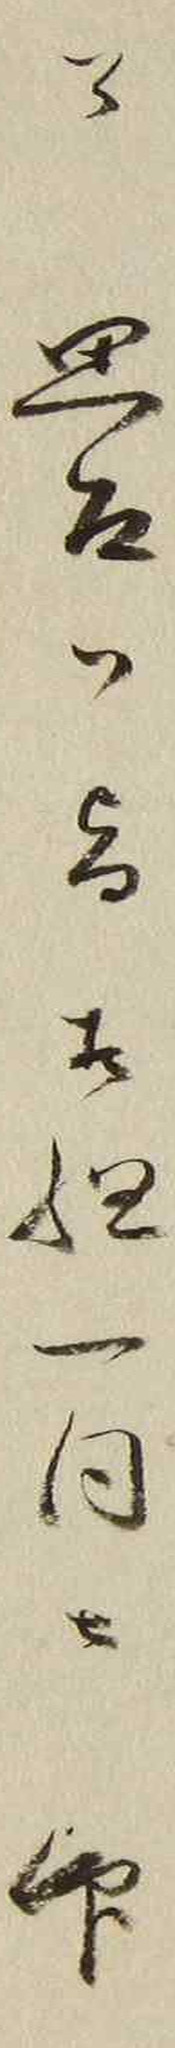被思召候旨相組一同被仰

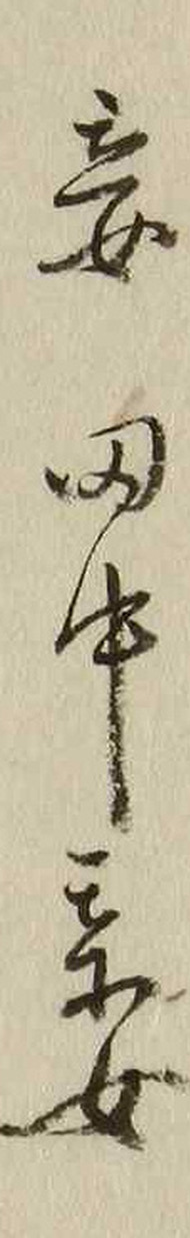妾田中某女
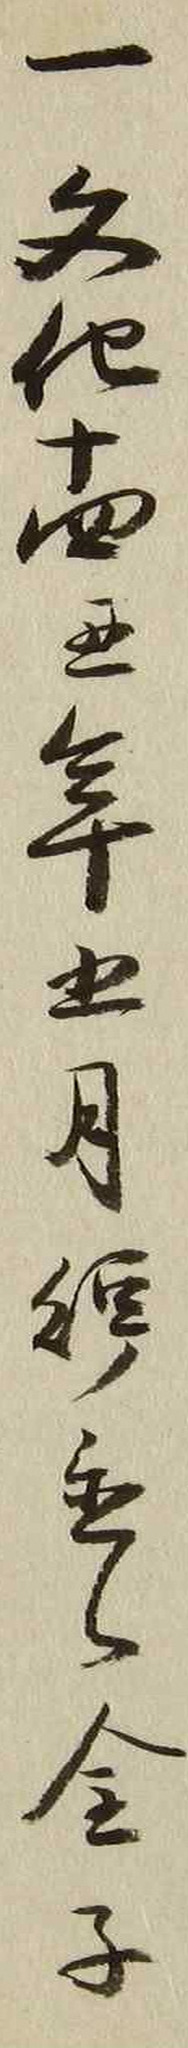一文化十四丑年五月貯置候金子
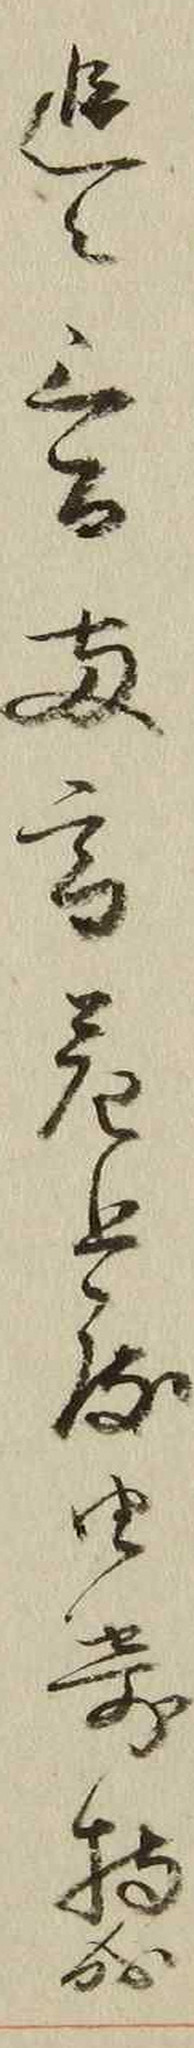追々三百両高差上度由寄特成
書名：諸士系譜　巻之288　さ之部20
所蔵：会津若松市立会津図書館
